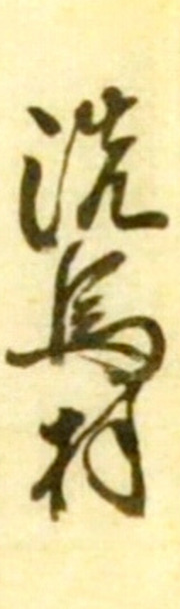洗馬村
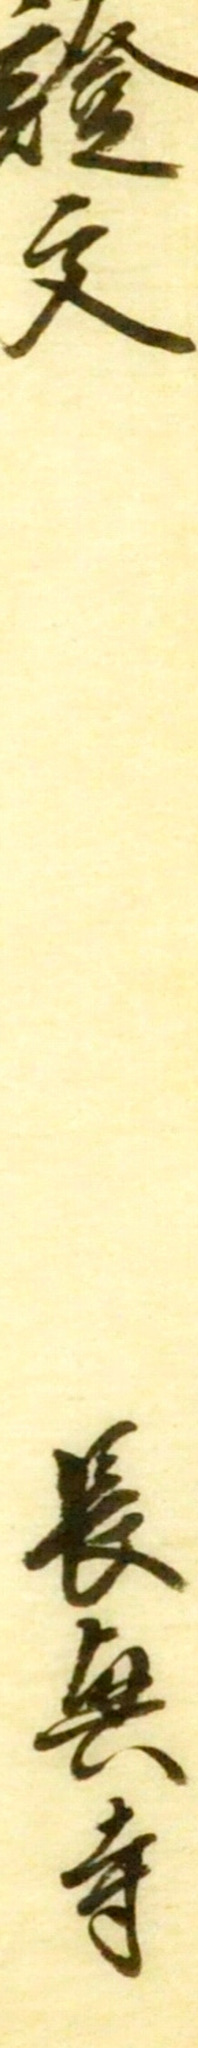証文長興寺

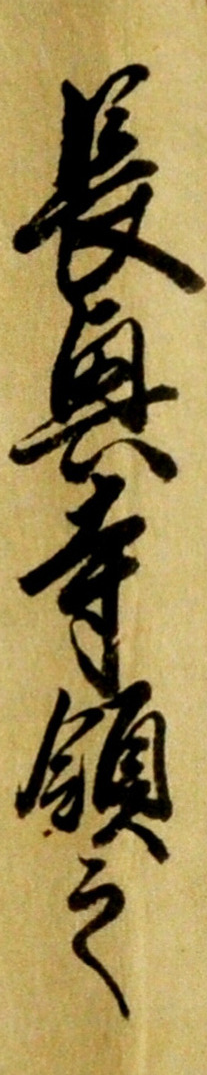長興寺領之
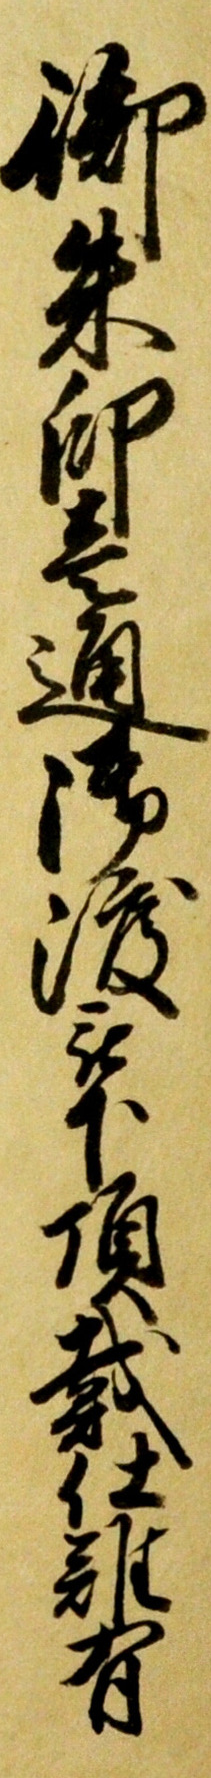御朱印壱通御渡被下頂戴仕難有
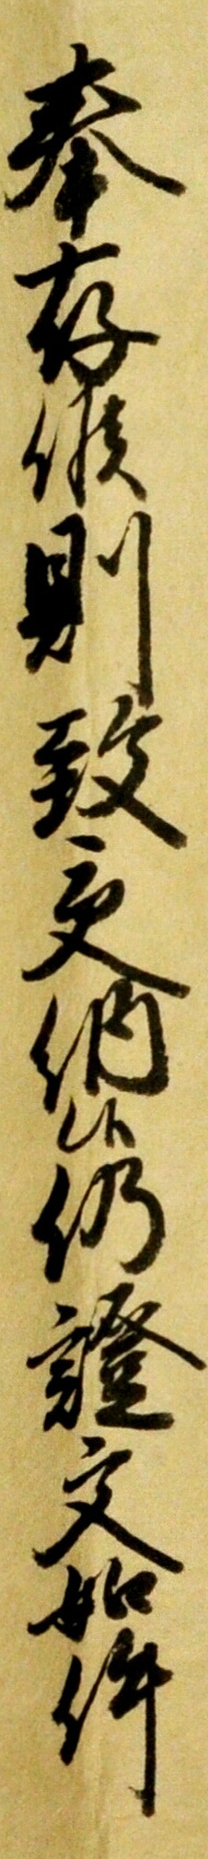奉存候則致受納候仍証文如件
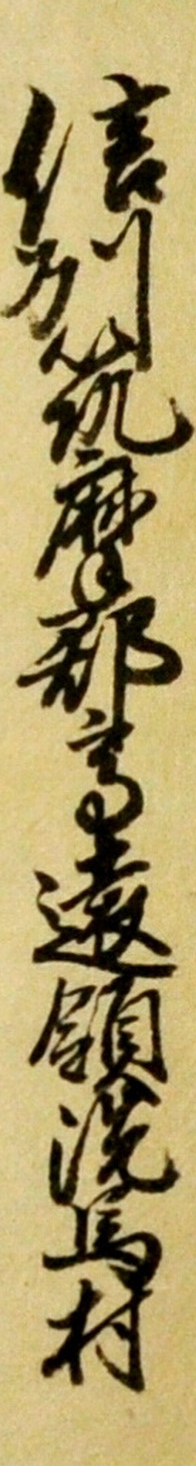信州筑摩郡高遠領洗馬村
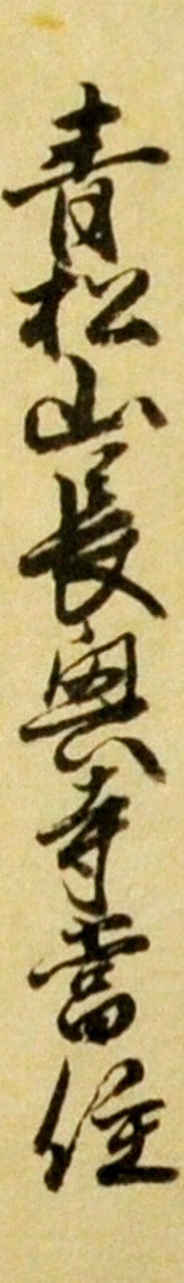青松山長興寺当住
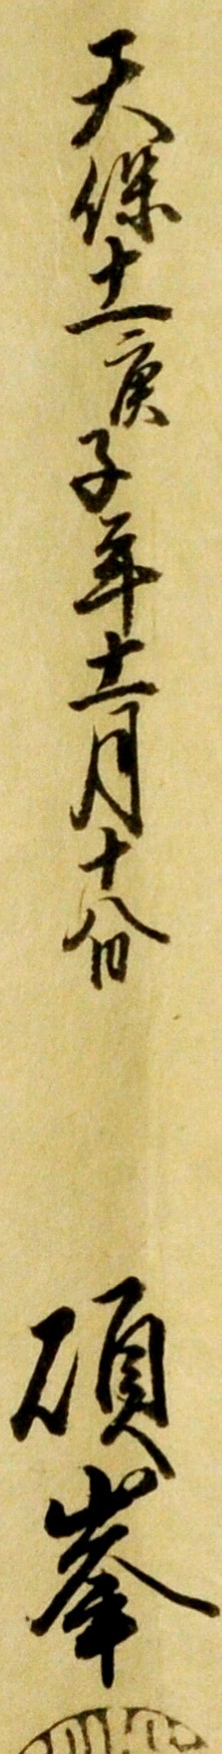天保十一庚子年十一月十八日碩峰㊞
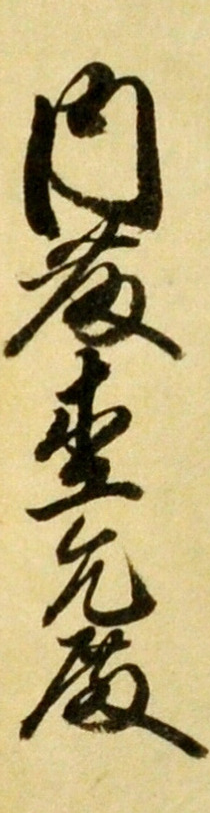内藤杢允殿
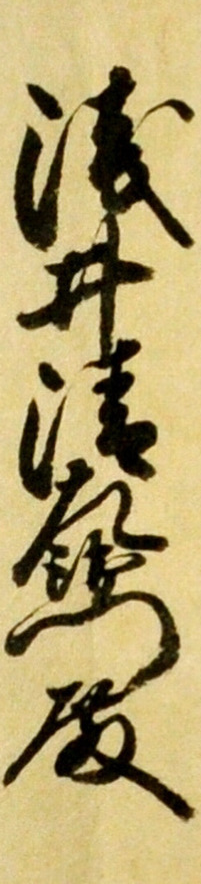浅井清左衛門殿
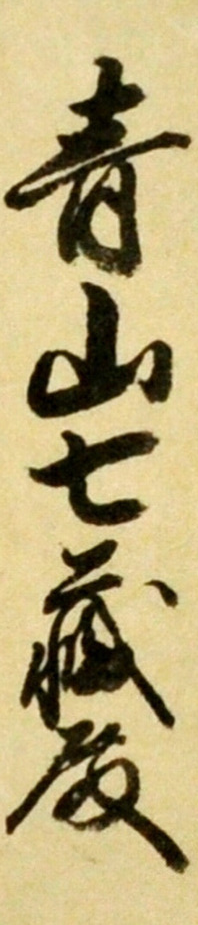青山七蔵殿
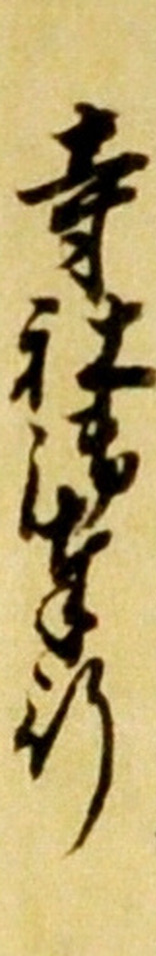寺社御奉行
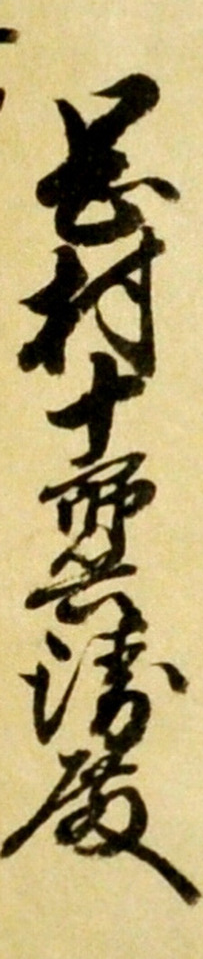岡村十郎兵衛殿
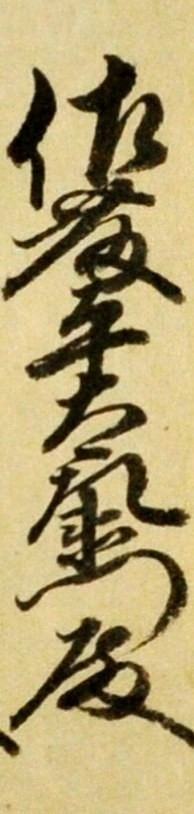佐藤平太左衛門殿
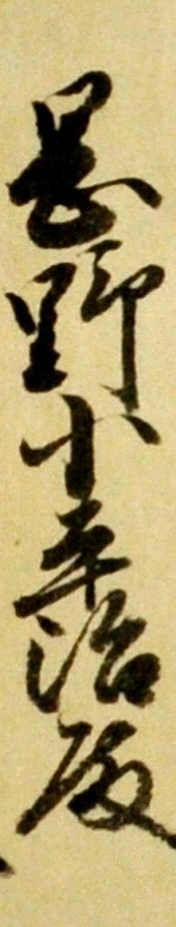岡野小平治殿
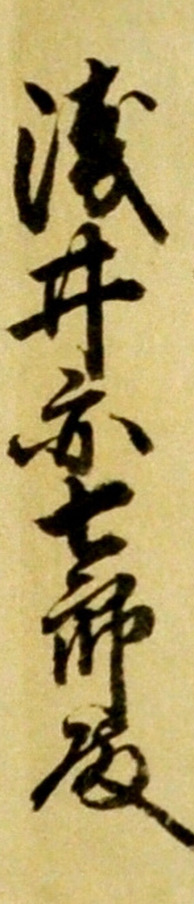浅井亦七郎殿
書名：証文
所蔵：伊那市立高遠町図書館・合同会社AMANE
